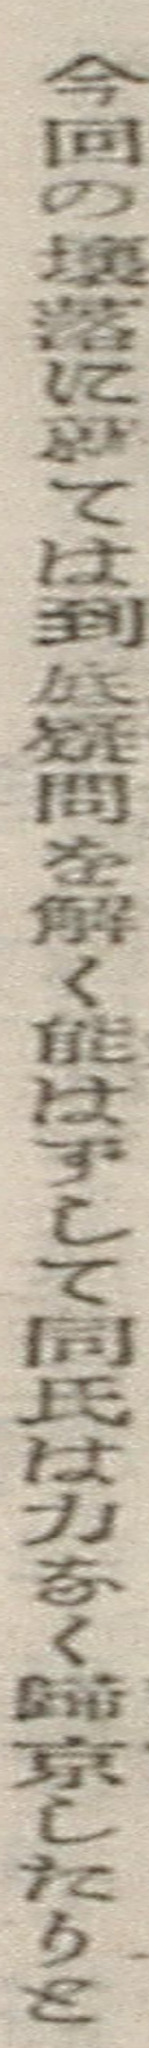今回の壤落に就ては到底疑問を解く能はずして同氏は力なく帰京したりと
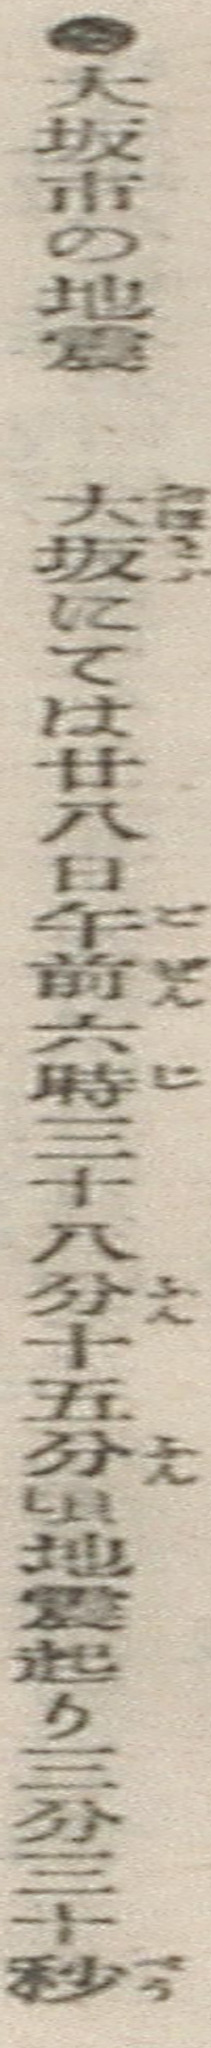●大坂市の地震大坂にては廿八日午前六時三十八分十五分頃地震起り三分三十秒
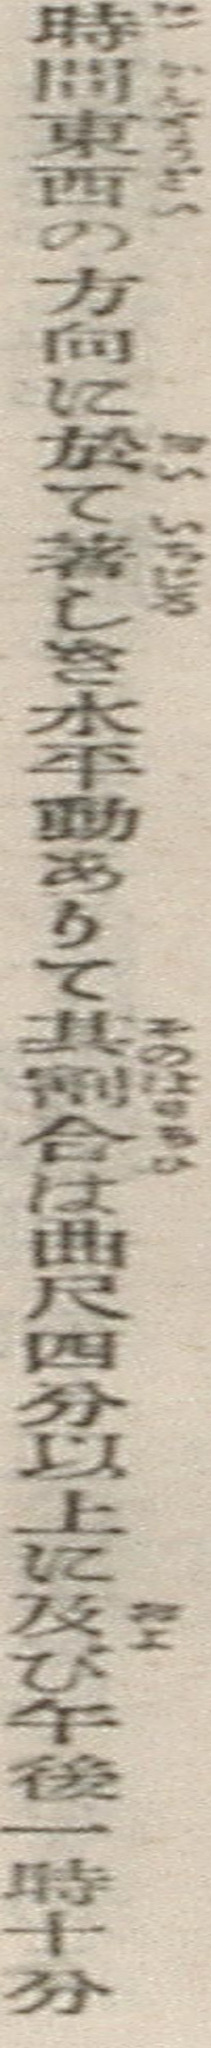時間東西の方向に於て著しき水平動ありて其割合は曲尺四分以上に及び午後一時十分
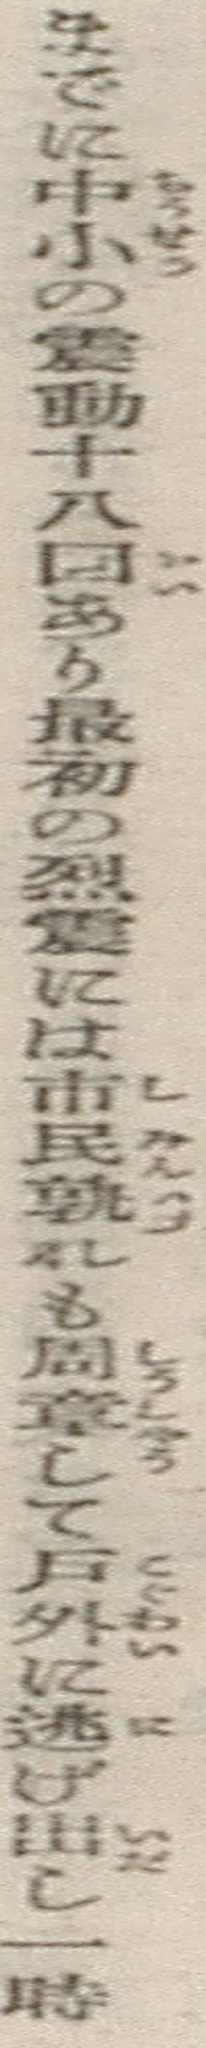までに中小の震動十八回あり最初の烈震には市民就れも周章して戸外に逃げ出し一時
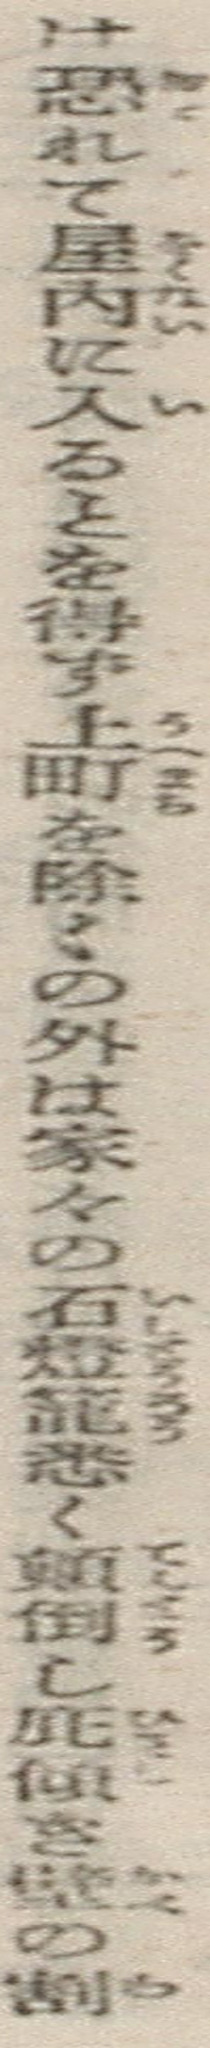は恐れて屋内に入ることを得ず上町を除くの外は家々の石燈籠悉く顛倒し庇傾き壁の割
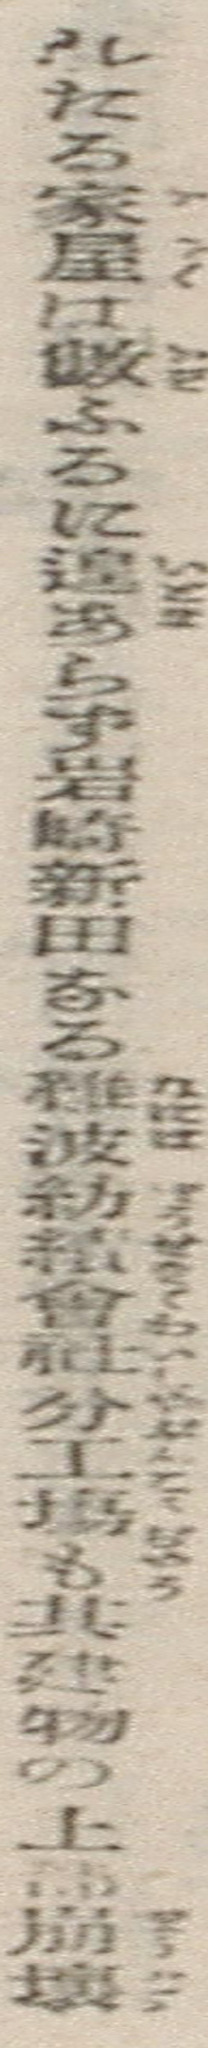れたる家屋は数ふるに遑あらず岩崎新田なる難波紡績會社分工場も其建物の上部崩壊
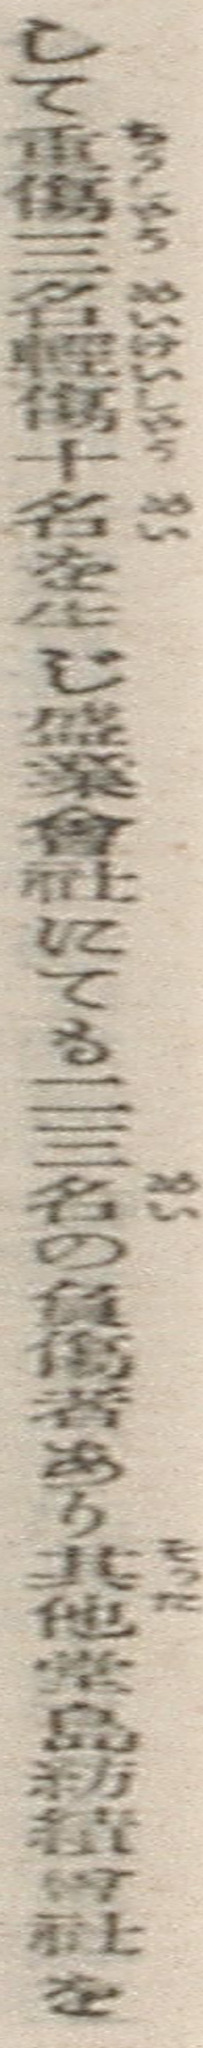して重傷三名輕傷十名を生じ盛業會社にても二三名の負傷者あり其他堂島紡績會社を
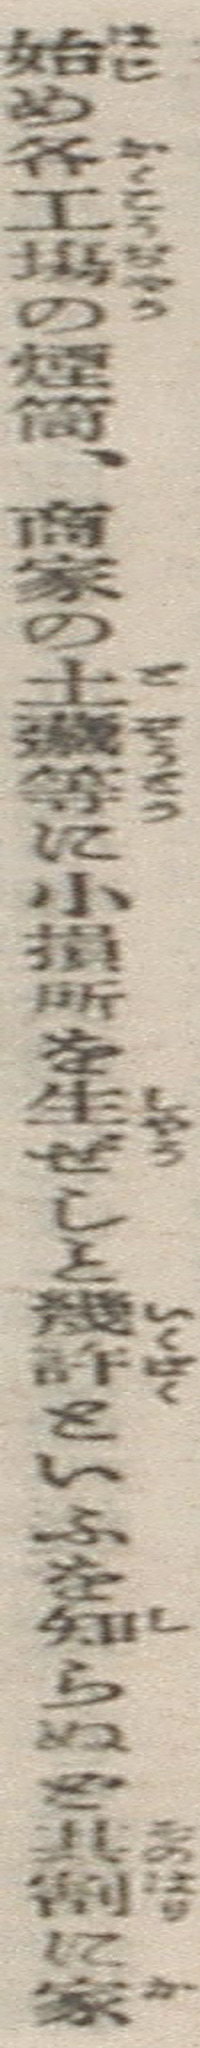始め各工場の煙筒、商家の土蔵等に小損所を生ぜしこと幾許といふを知らねど其割に家
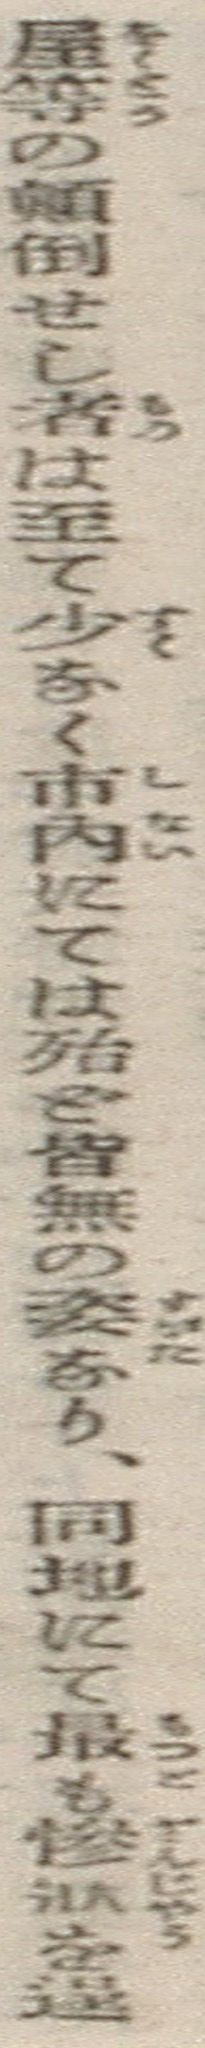屋等の顛倒せし者は至て少なく市内にては殆ど皆無の姿なり、同地にて最も惨状を逞
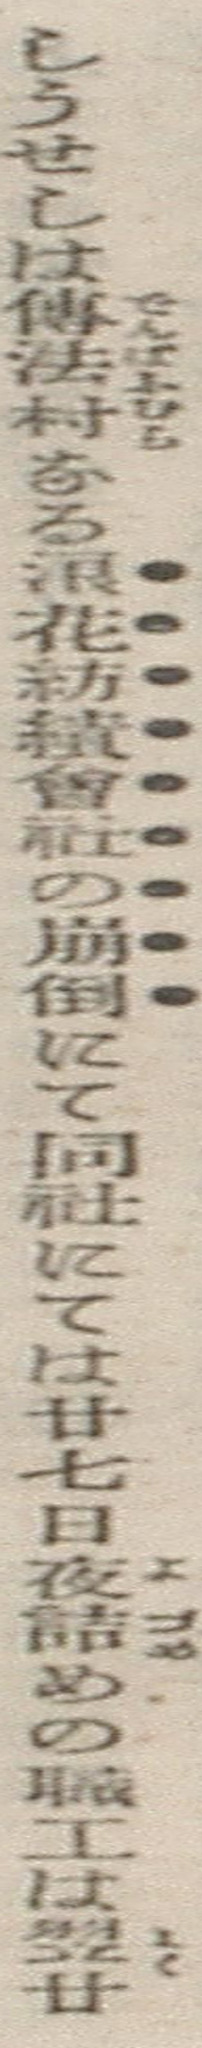しうせしは傳法村なる浪花紡績會の崩倒●●●にて同社にては廿七日夜詰の職工は翌廿
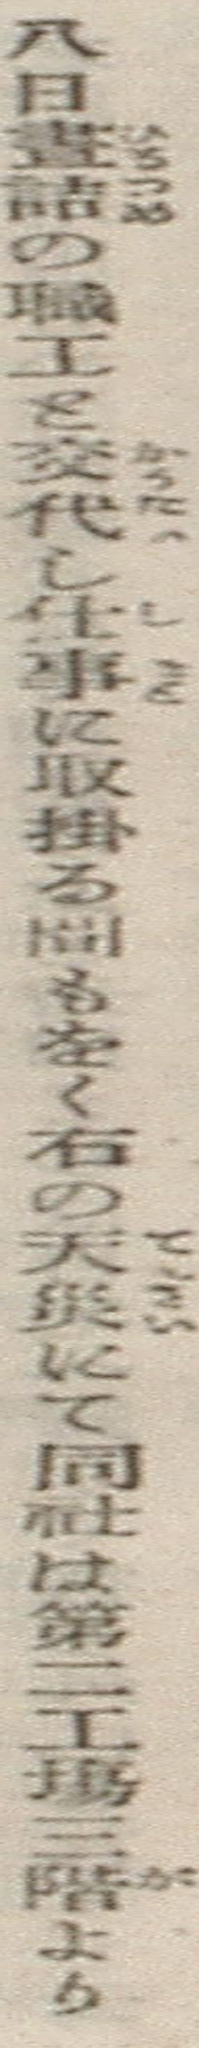八日晝詰の職工と交代し仕事に取掛る間もなく右の天災にて同社は第二工場三階より
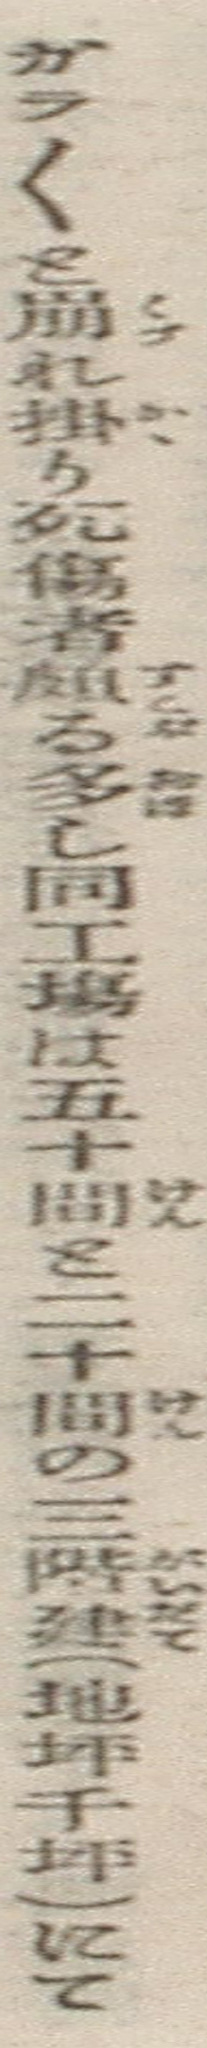ガラ〳〵と崩れ掛り死傷者頗る多し同工場五十間と二十間の三階建にて
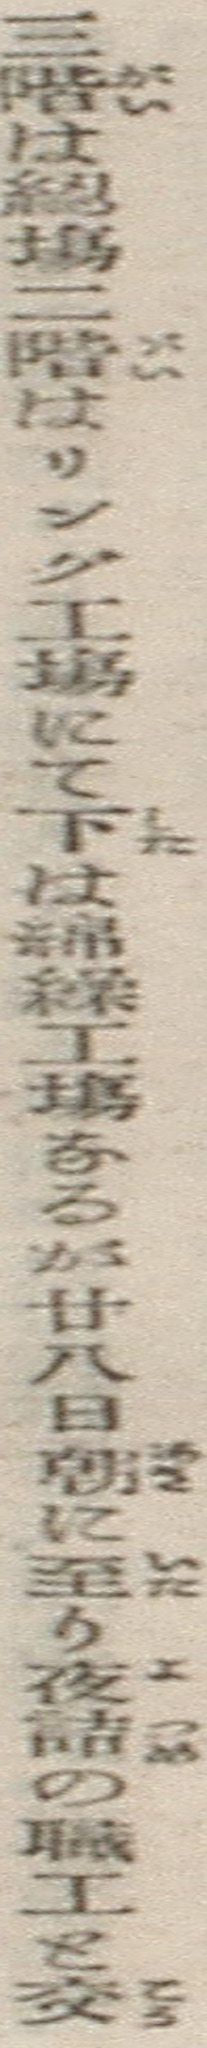三階は綛場二階はリング工場にて下は綿繰工場なるが廿八日朝に至り夜詰の職工と交
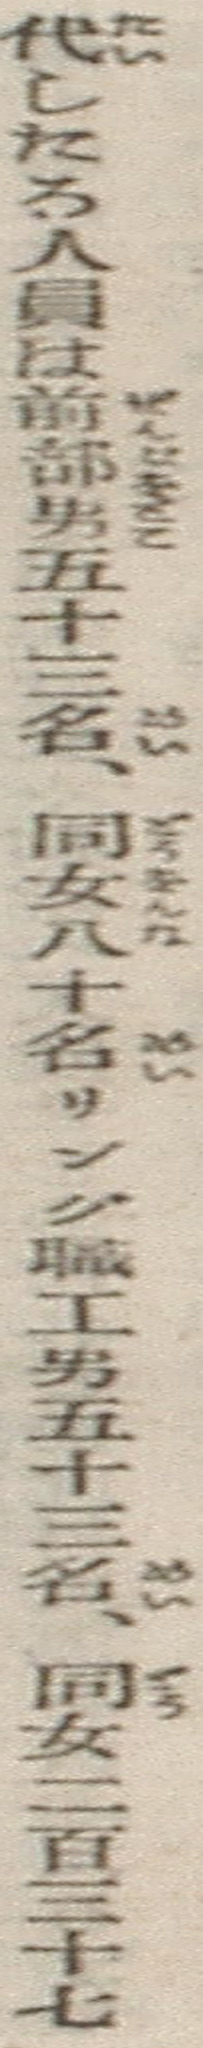代したる人員は前部男五十三名、同女八十名リング職工男五十三名、同女二百三十七
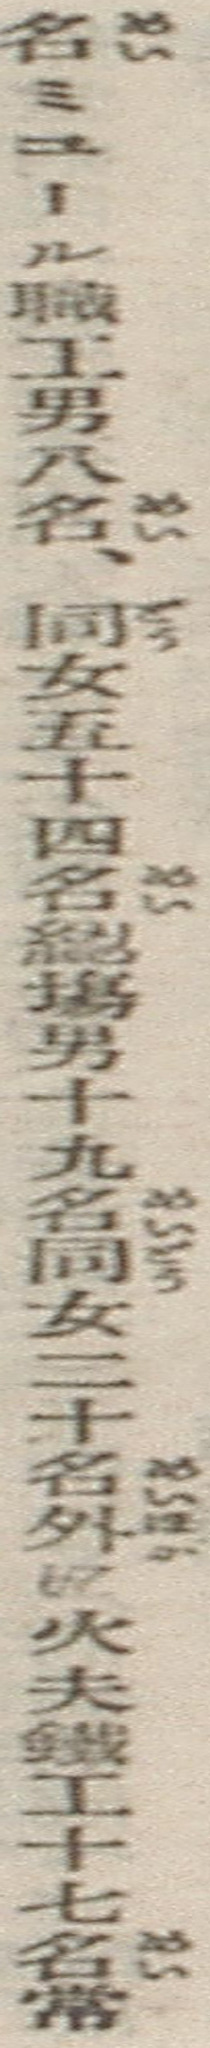名ミユール職工男八名、同女五十四名綛場男十九名同女二十名外に火夫鐡工十七名常
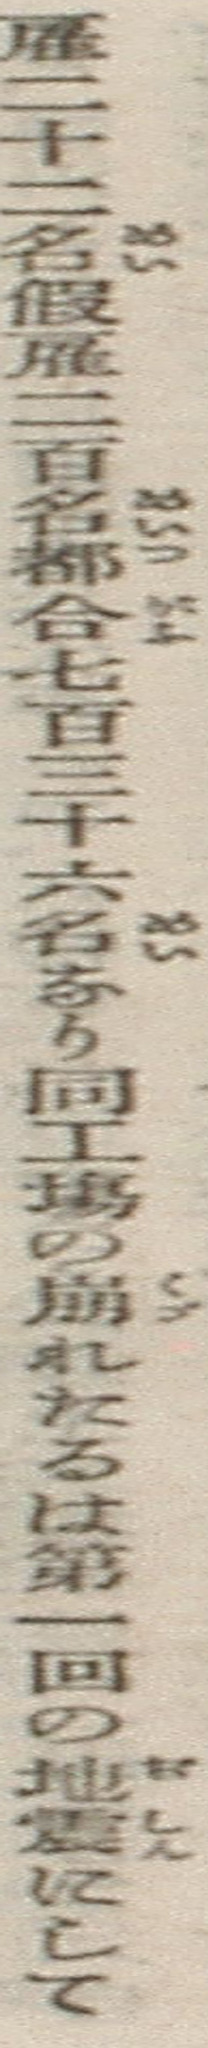雇二十二名假雇二百名都合七百三十六名なり同工場の崩れたるは第一回の地震にして
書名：愛知岐阜福井三県　大地震見聞録（内題）
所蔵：東京大学地震研究所図書室 Earthquake Research Institute Library, The University of Tokyo, JAPAN
